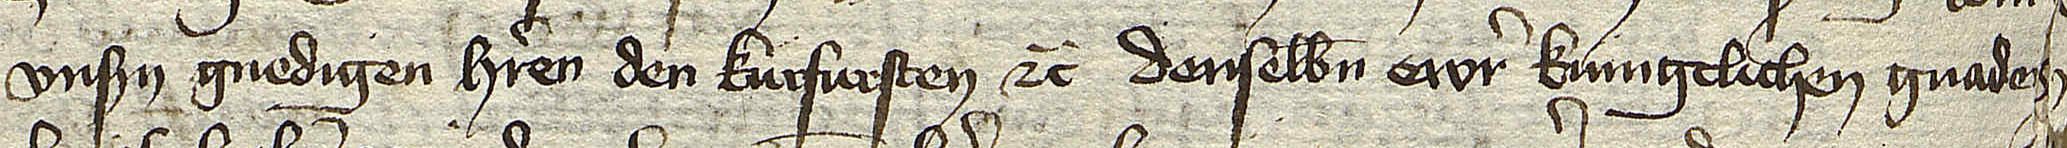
vnſ*n gnedigen h*ren den kürfurſten ec* denſelb*n ewr* kunigclichen gnaden
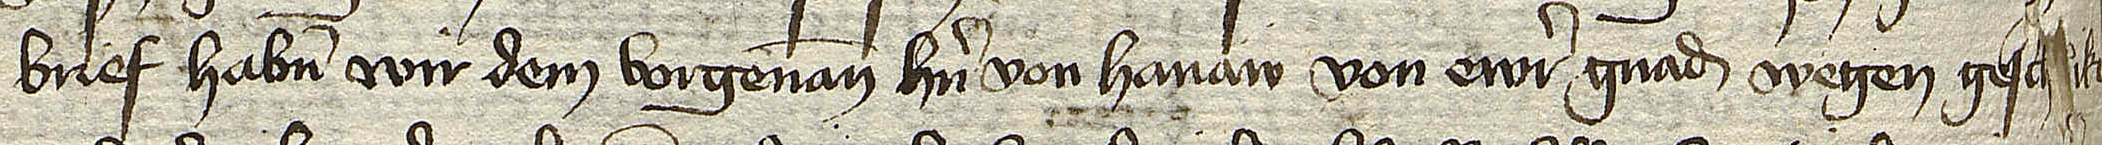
brief hab*n wir dem vorgenan* h*n von hanaẅ von ewr* gnad* wegen geſchikt
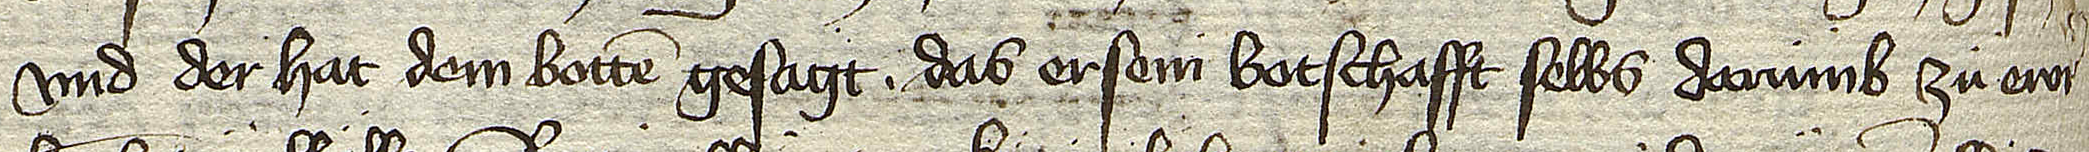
vnd der hat dem botte* geſagt . das er ſein botſchafft ſelbs darümb cʒü ewr*
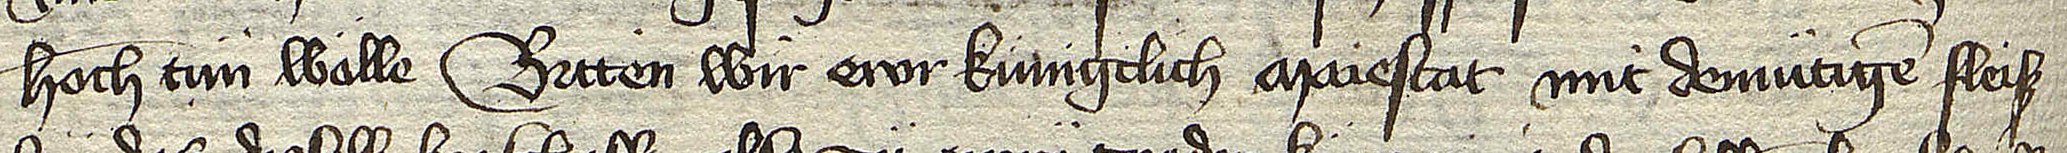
hoch* tün wölle Bitten Wir ewr künigclich Maieſtat mit demütige* fleiſʒ
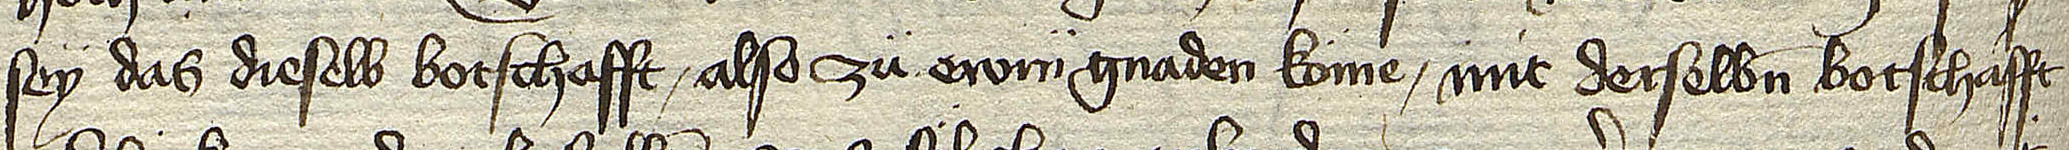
ſey das dieſelb botſchafft / alſo cʒü ewr*n gnaden köme / mit derſelb*n botſchafft
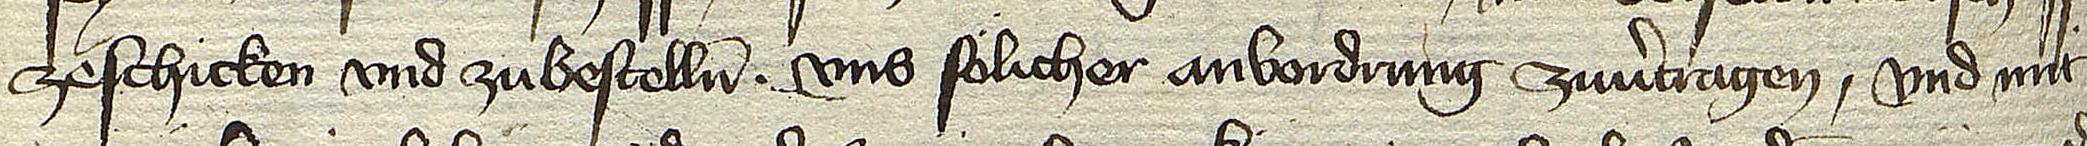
cʒeſchicken vnd cʒubeſtell*n . vns ſölicher anvordrung cʒuu*tragen / vnd mit
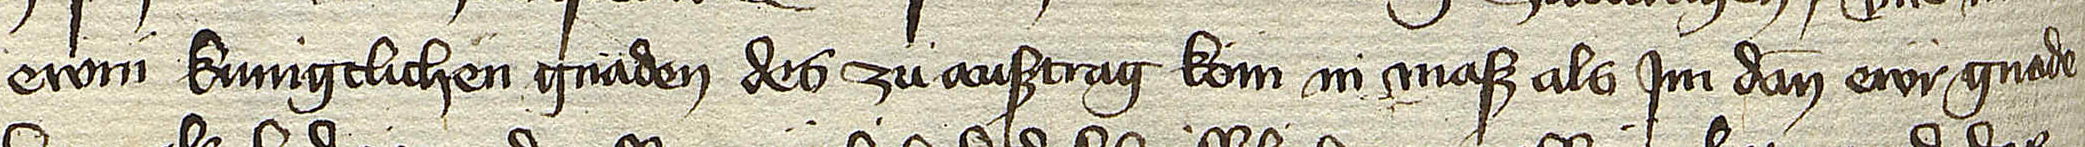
ewrn kunigclichen gnaden des cʒü auſʒtrag köm in maſʒ als Im dan* ewr gnade
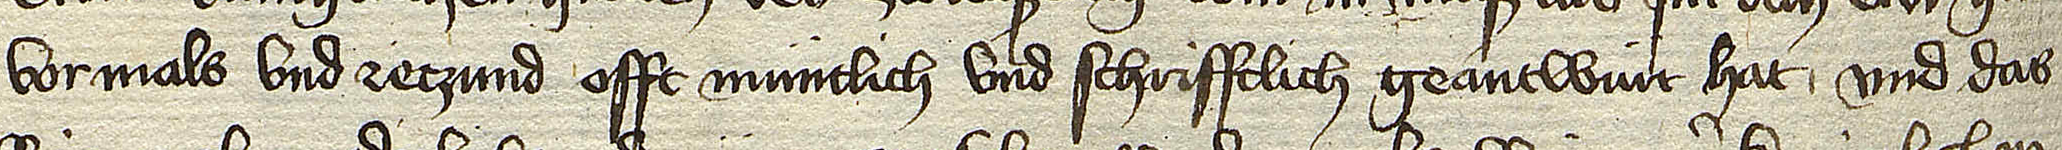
vormals vnd iecʒund offt müntlich vnd ſchrifftlich geantwürt hat / vnd das
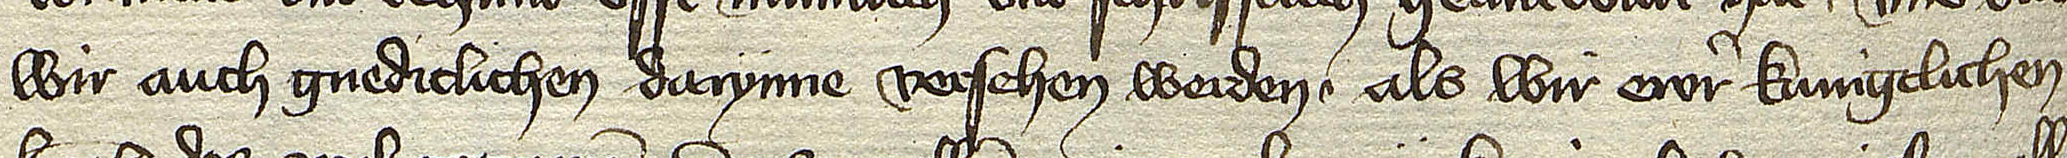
wir auch gnediclichen darynne verſehen werden . als wir ewr* kunigclichen
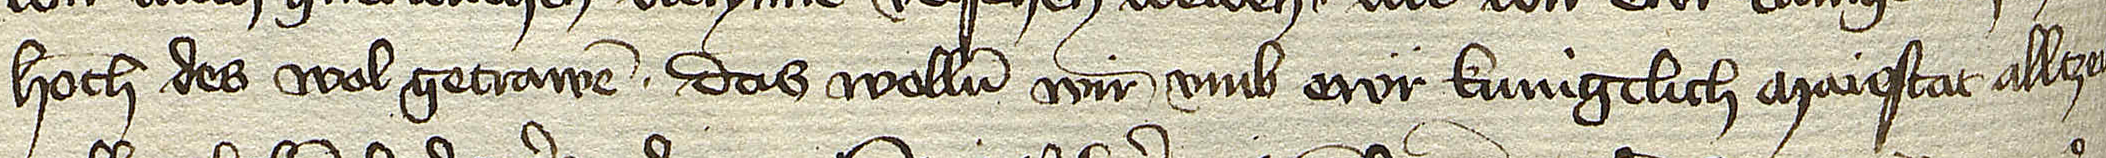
hoch* des wol getrawe* . Das woll*n wir vmb ewr kunigclich Maieſtat allcʒeit
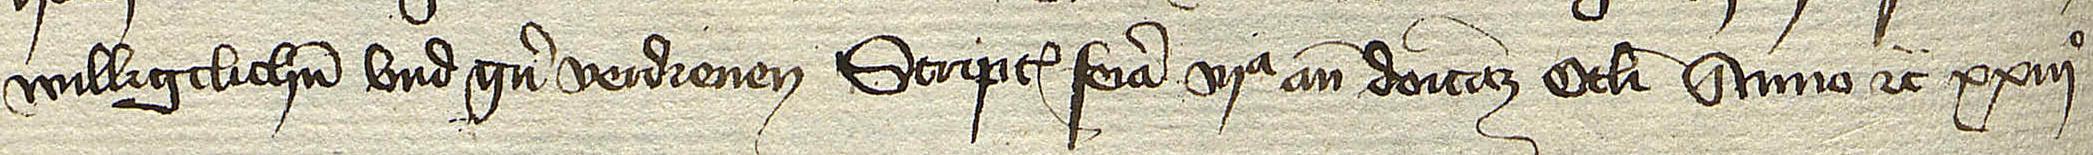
willigclich*n vnd g*n verdienen Script* fe*ia vi* an* doica* Ocli* Anno ec* xxiii*
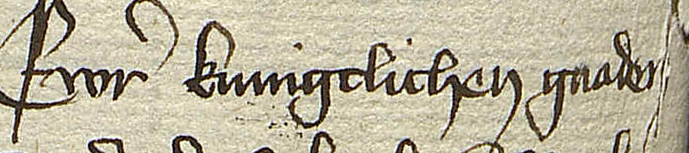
Ewr* kunigclichen gnaden
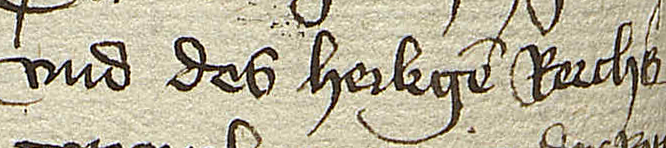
vnd des heilige* Reichs
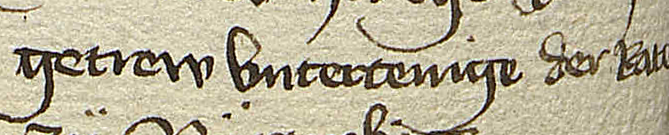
getrew vntertenige der Rate
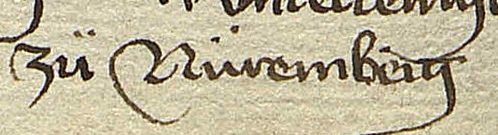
cʒü Nüremberg
